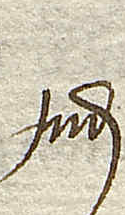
Iud*
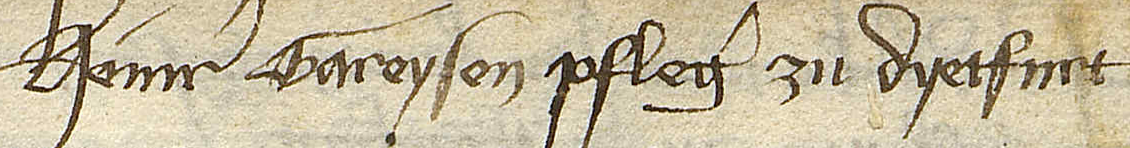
Heinr* Gareyſen pfleg* ʒu Dyetfurt
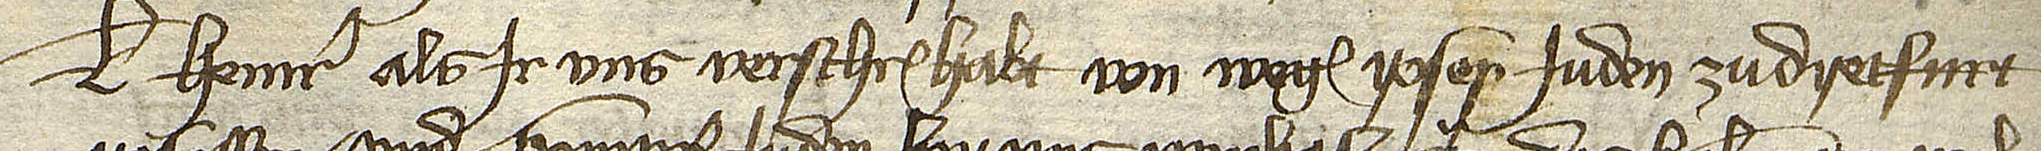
L* Heinr* als Ir vns verſchr* habt von weg* yoſep Iuden ʒu Dyetfurt
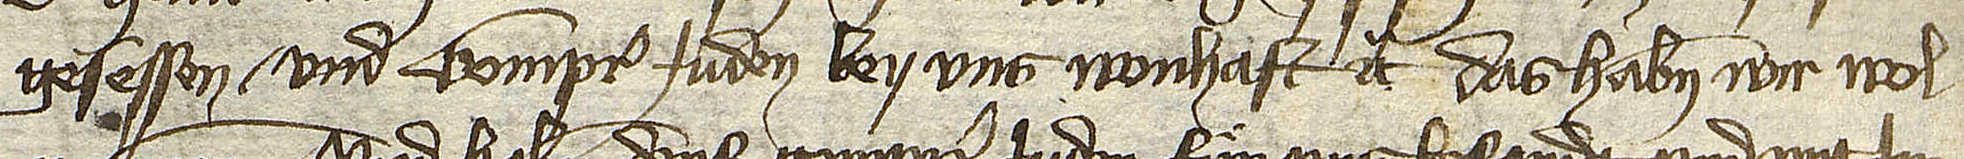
geſeſſen / vnd Gompr* Iuden bey vns wonhaft ec* Das habn* wir wol
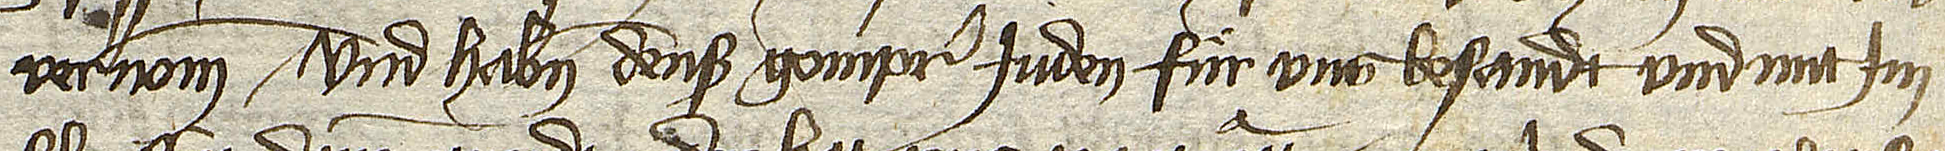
vernom* / vnd habn* denſ* gompr* Iuden für vns beſandt vnd mit Im
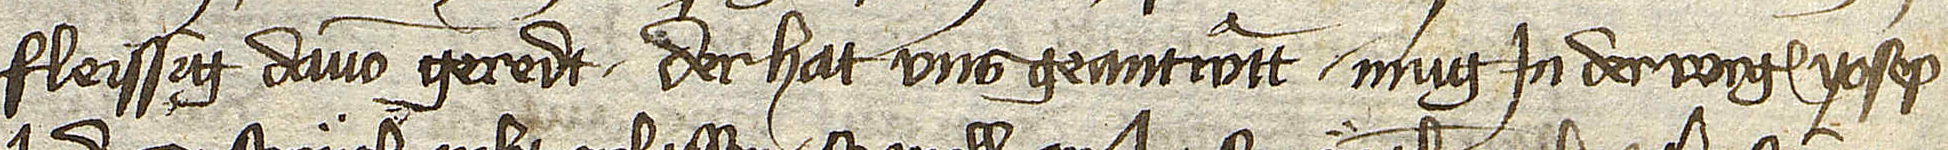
fleiſſig dauo* geredt / Der hat vns geantw*tt / mug In der vorg* yoſep
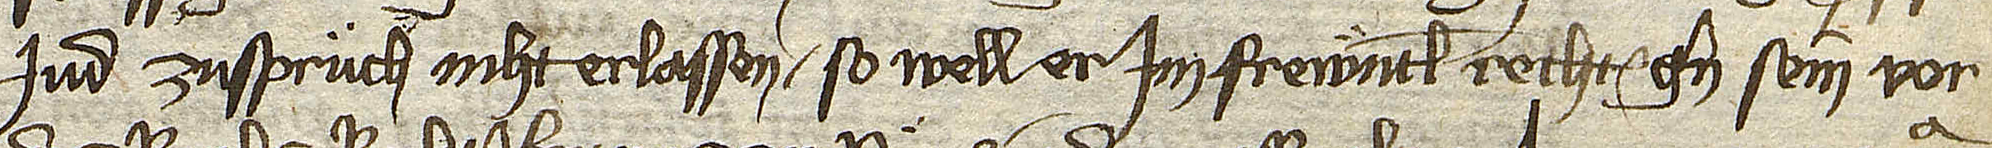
Iud ʒuſprüch niht erlaſſen / ſo well er Im freẅntl* recht* g*n ſein vor
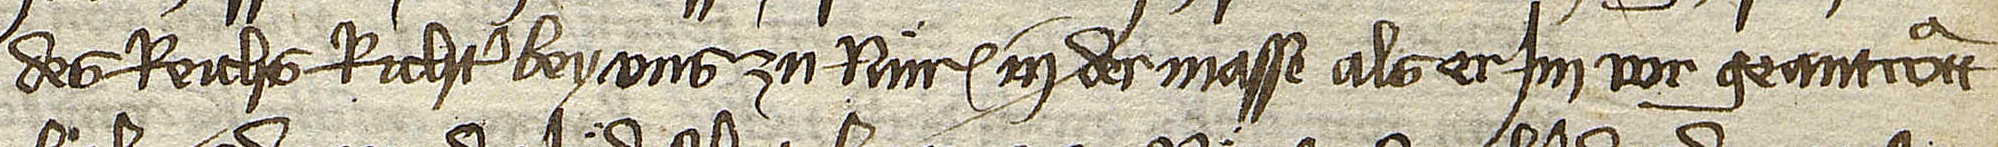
des Reichs Richt* bey vns ʒu Nür* in der maſſe als er Im vor geantw*tt
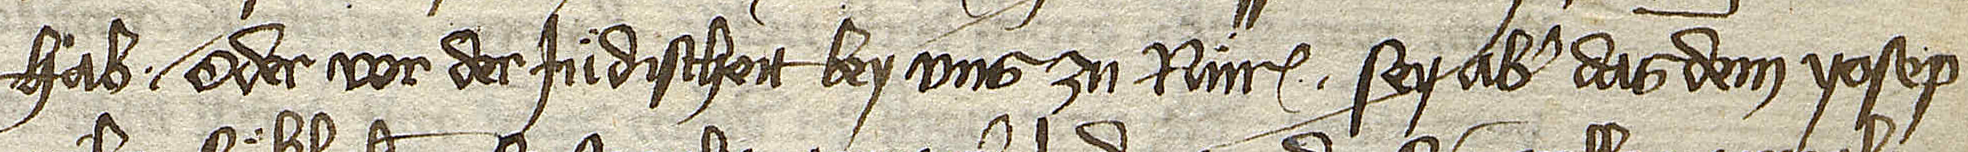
hab / Oder vor der Iüdiſcheit bey vns ʒu Nür* / ſey ab* das dem yoſep
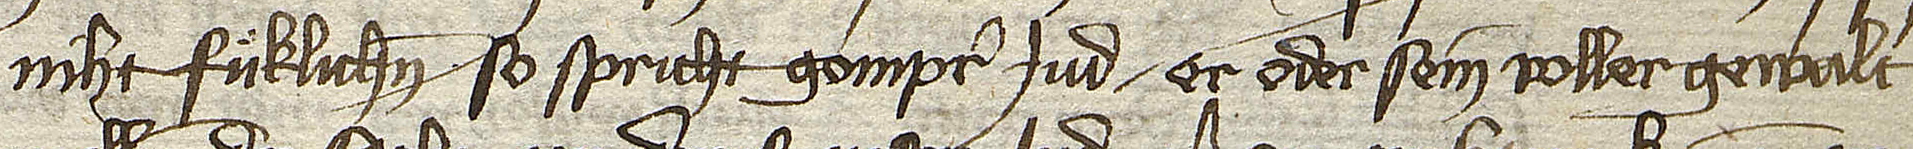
niht füklichn* ſo ſpricht gompr* Iud / er oder ſein voller gewalt
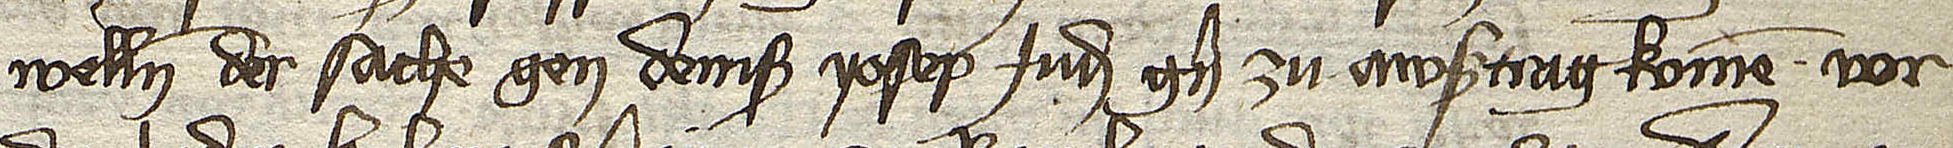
welln* der ſache gen demſ* yoſep Iud* g*n ʒu awſʒtrag kome* . vor
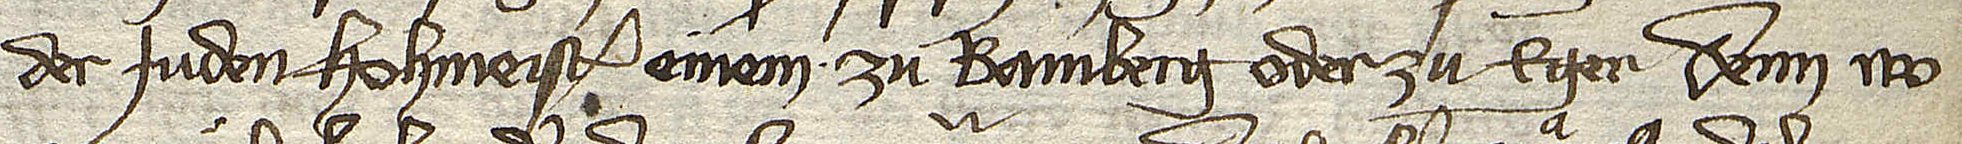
der Iuden Hohmeiſt* einem ʒu Bamberg oder ʒu Eger Denn wo
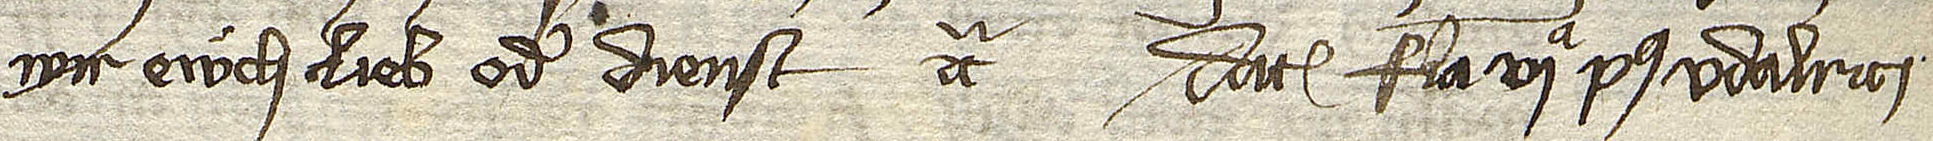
wir eẅch lieb od* dienſt ec* / Dat* fi*a vi* p* vdalrici
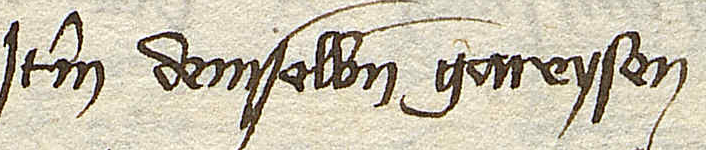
It*m demſelbn gareyſen
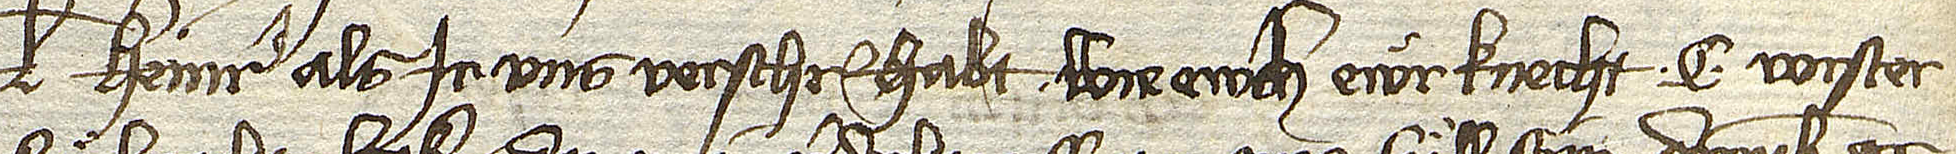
L* Heinr* als Ir vns verſchr* habt . wie ewch eẅr knecht . C . vorſter
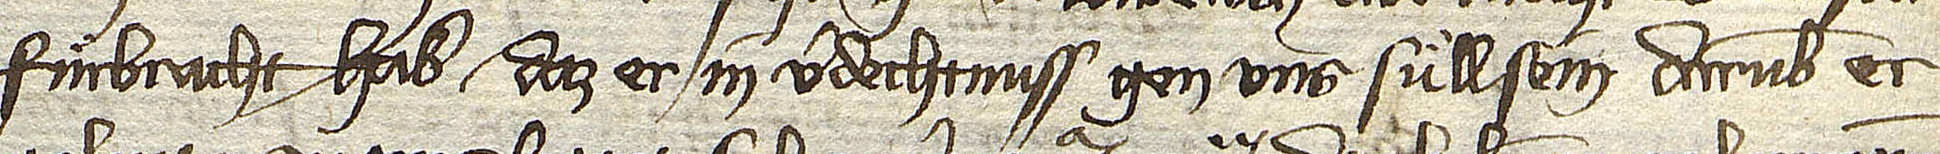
fürbracht hab / daʒ er in v*dechtnuſſ gen vns ſüll ſein darub* er
